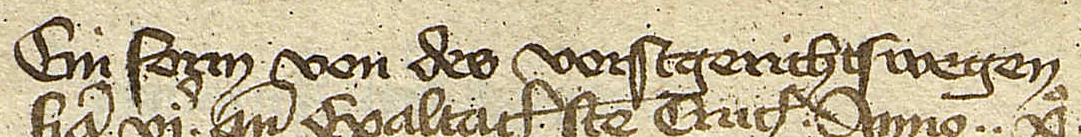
Ein form von des vorſtgerichtſ wegen
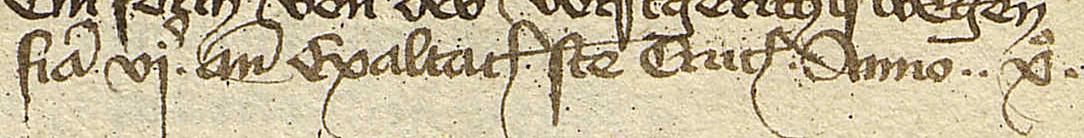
fia* vi . an* Exaltac* ſce Cruc* . Anno . . x* .
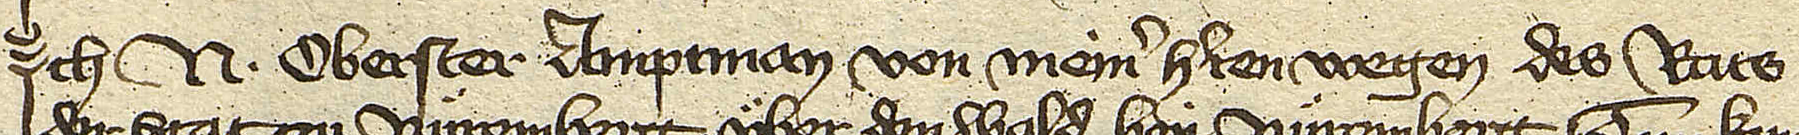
Ich N. Oberſter Amptman von mein* h*ren wegen des Rats
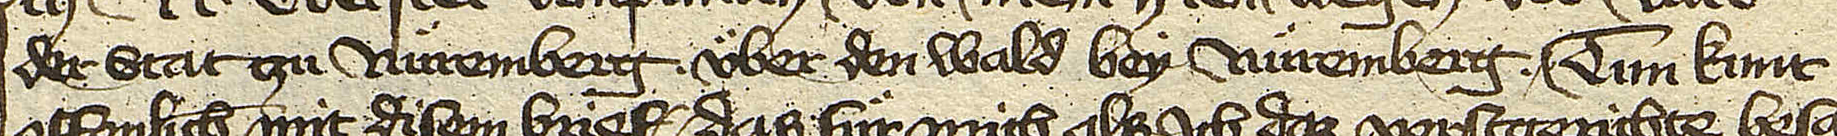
der Stat cʒu Nüremberg . v̈ber den wald bey Nüremberg . Tun kunt
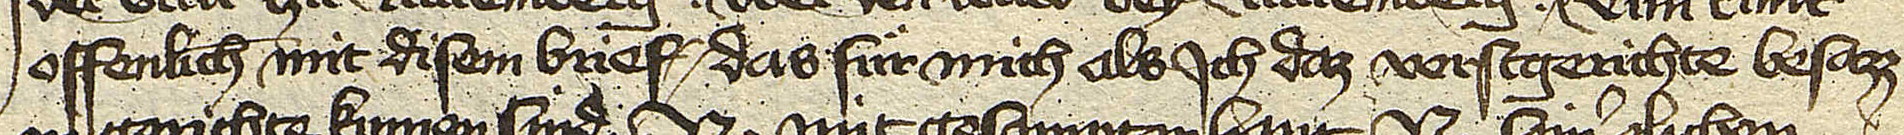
offenlich* mit diſem brief / das für mich als Ich daʒ vorſtgerichte beſaʒʒ
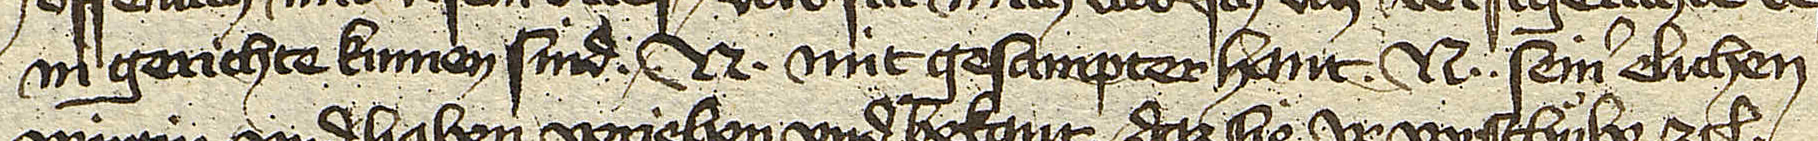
in gerichte kumen ſind . / . N . mit geſampter hant . N . . ſein* elichen
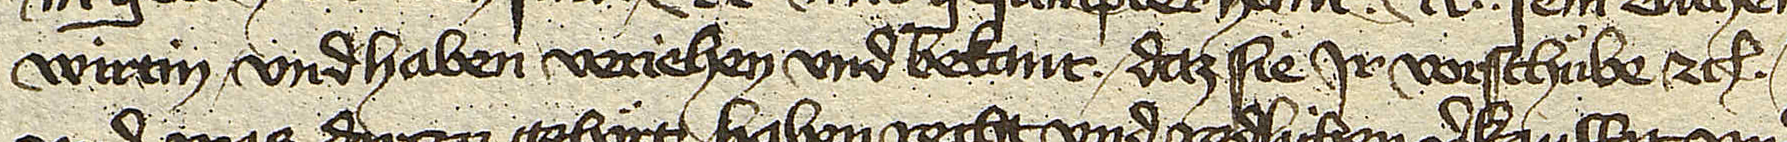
wirtin vnd haben veriehen vnd bekant . / daʒ ſie Ir vorſchübe ec* .
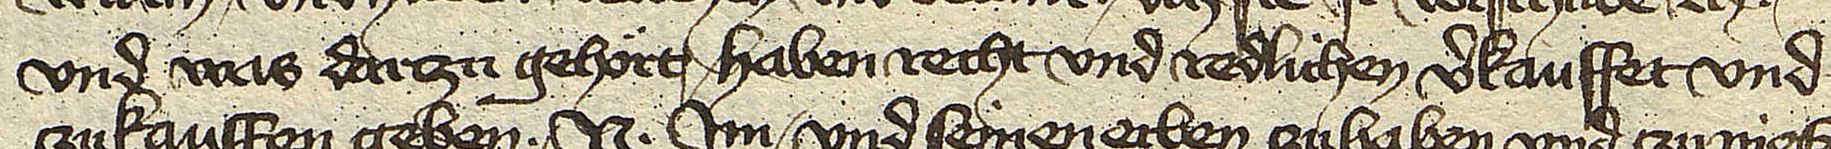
vnd was darcʒu gehört haben recht vnd redlichen v*kauffet vnd
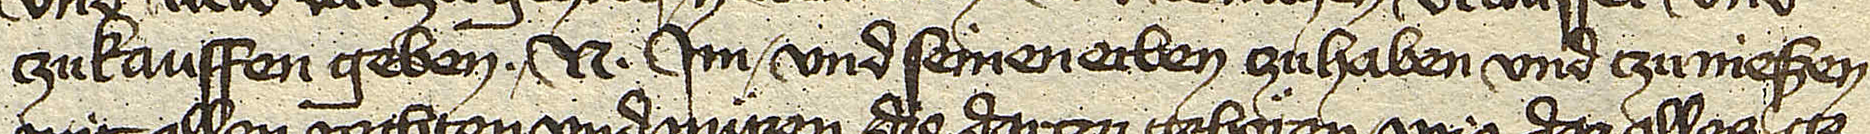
cʒukauffen geben . N . Im / vnd ſeinen erben cʒuhaben vnd cʒu nieſʒen
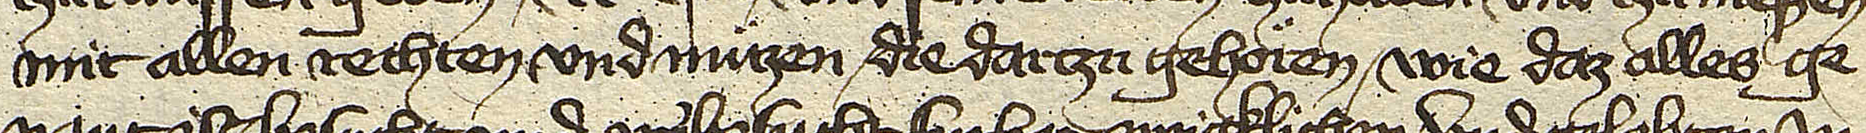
mit allen rechten vnd nücʒen / die darcʒu gehören / wie daʒ alles ge
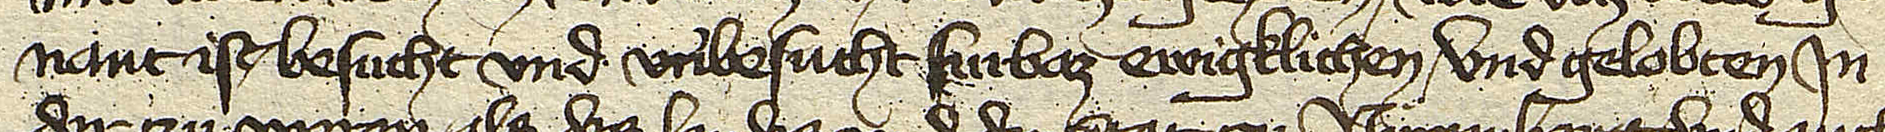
nant iſt / beſucht vnd vnbeſucht furbaʒ ewigklichen / vnd gelobten In
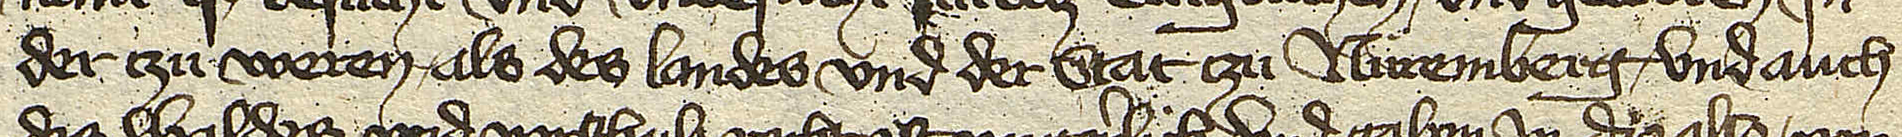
der cʒu weren / als des landes vnd der Stat cʒu Nüremberg / vnd auch
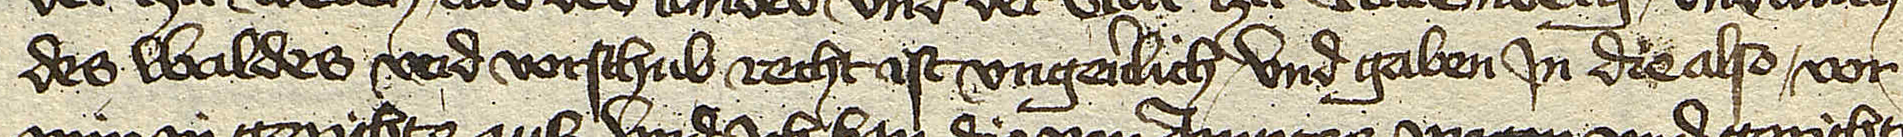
des waldes vnd vorſchub recht iſt vngeu*lich vnd gaben In die alſo / vor
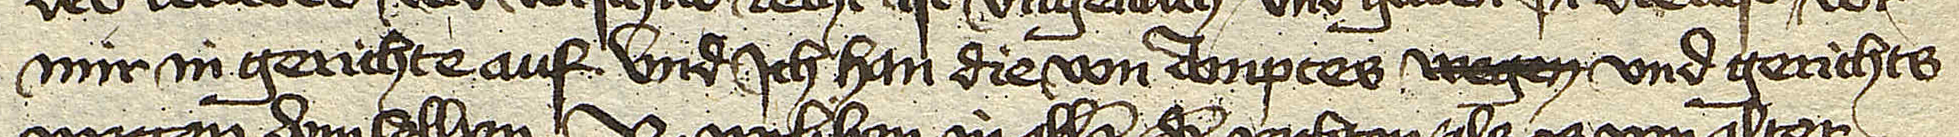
mit in gerichte auf vnd Ich han die von Amptes wegen vnd gerichts
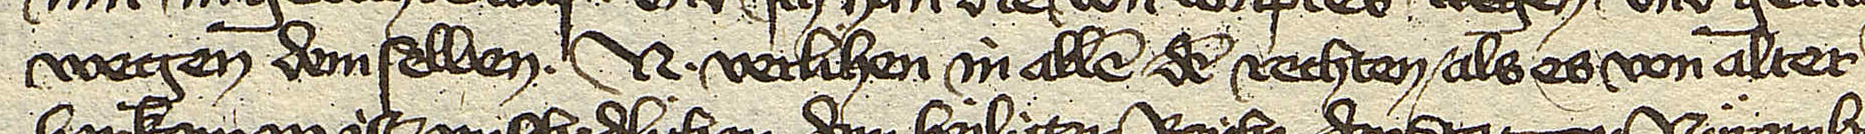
wegen demſelben . N . verlihen in alle* / de* rechten / als es von alter
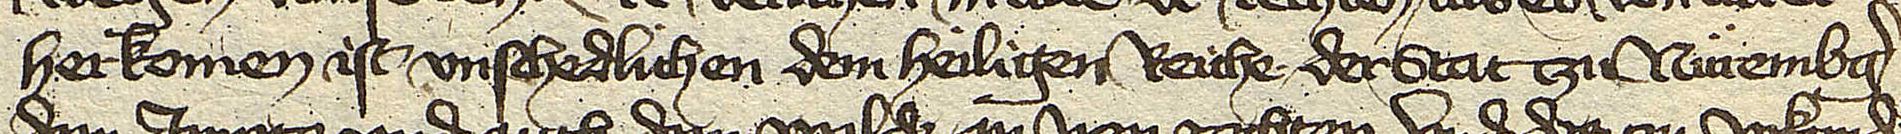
herkomen iſt vnſchedlichen dem heiligen Reiche der Stat cʒu Nürembg*
